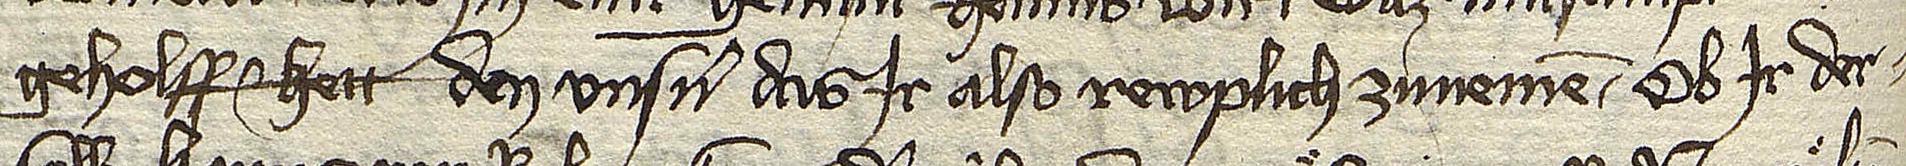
geholff* hett den vnſ*n das Ir alſo rewplich ʒuneme* / Ob Ir der =
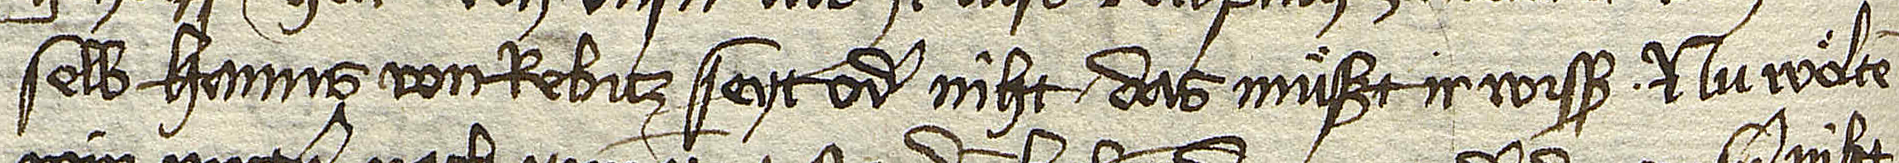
ſelb hanns von Rebicʒ ſeyt od* niht / das müſʒt ir wiſſ* . Nu wölte*
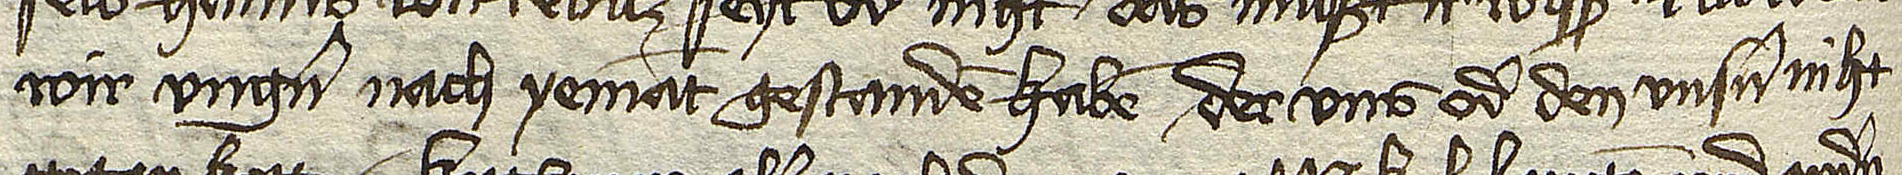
wir vngn* nach yemat* geſtande* habe* / der vns od* den vnſ*n niht
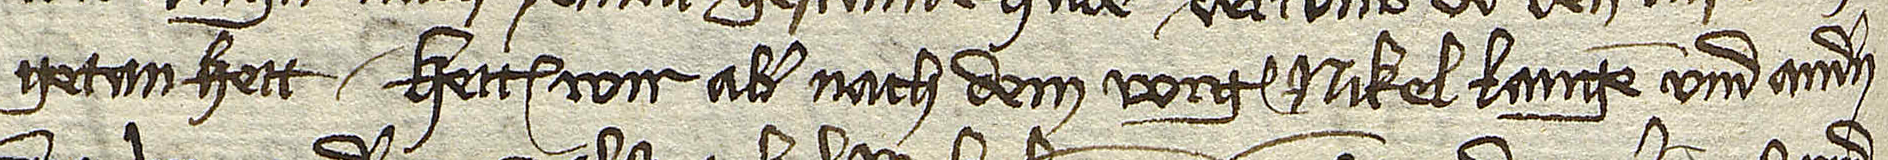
getan hett / Hett* wir ab* nach dem vorg* Nikel lange* vnd and*n
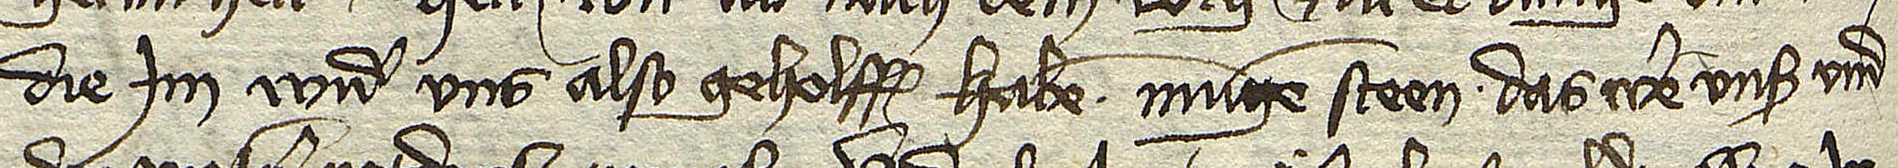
die Im wid* vns alſo geholff* habe* . muge* ſteen . das w*e vnſ* vnd
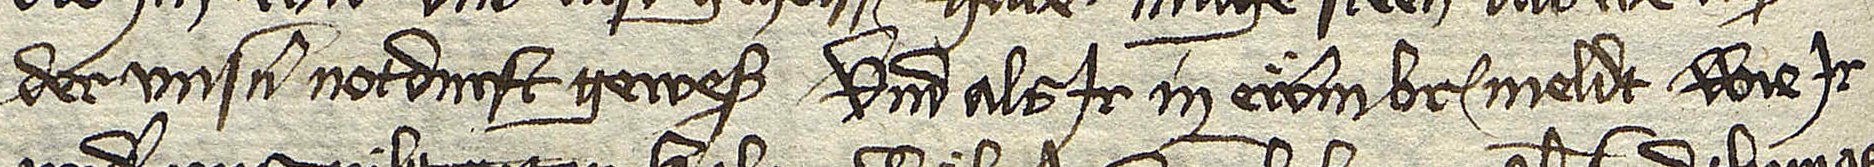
der vnſ*n notdurft geweſ* / Vnd als Ir in eẅm* br* meldt / wie Ir
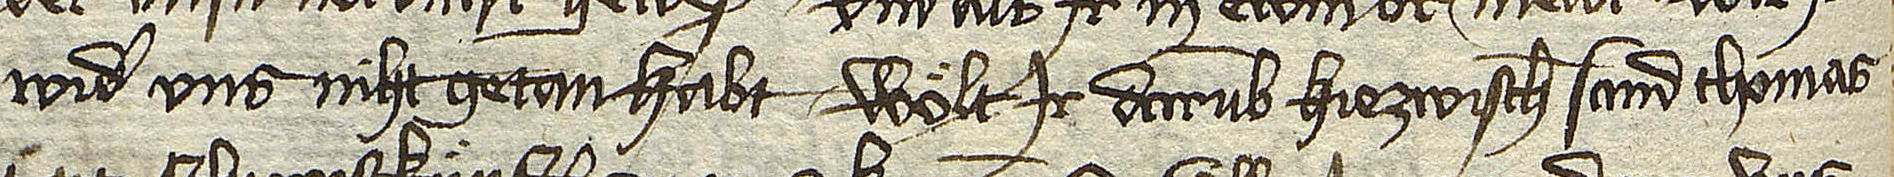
wid* vns niht getan habt / wölt Ir darub* hieʒwiſch* ſand thomas
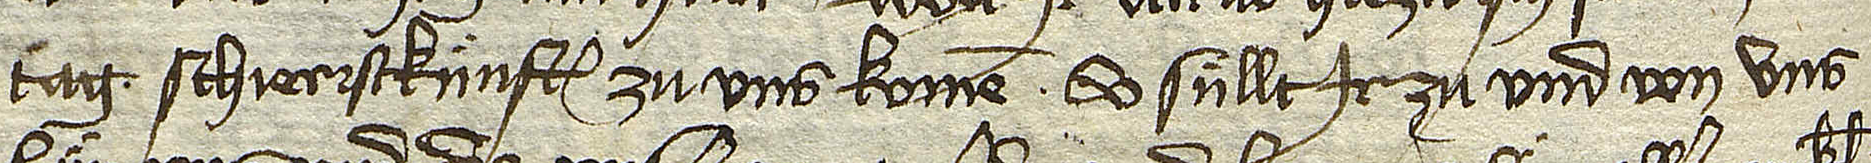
tag . ſchieriſtkünft* ʒu vns kome* . So ſüllt Ir ʒu vnd von vns
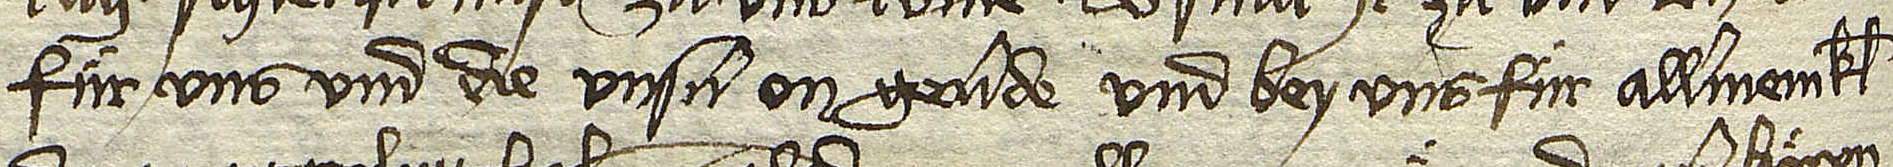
für vns vnd die vnſ*n on geu*de vnd bey vns für all*menikl*
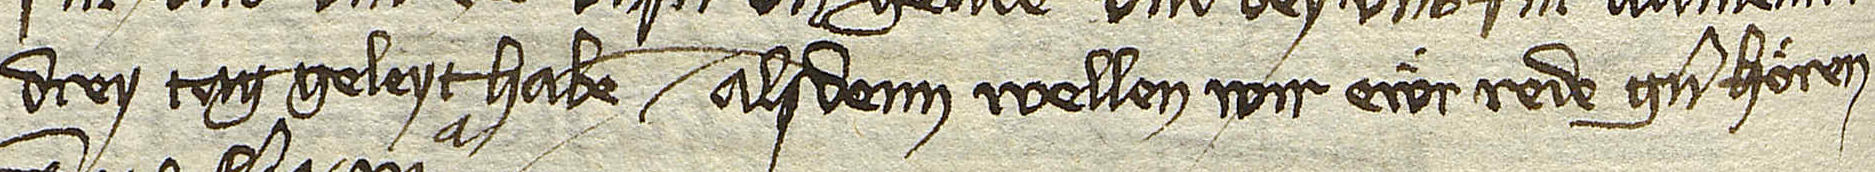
drey tag geleyt habe* / alſdenn wellen wir eẅr rede g*n hören
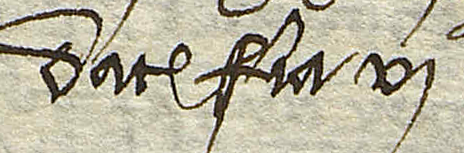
Dat* f*ia vi*
